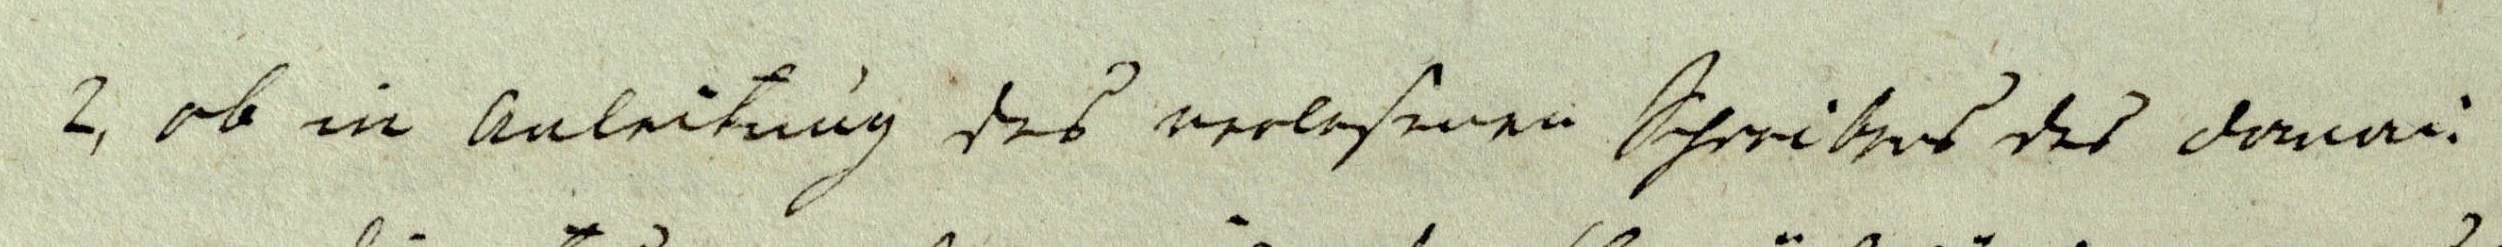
2, ob in Anleitung des verlesenen Schreibens des Domai¬
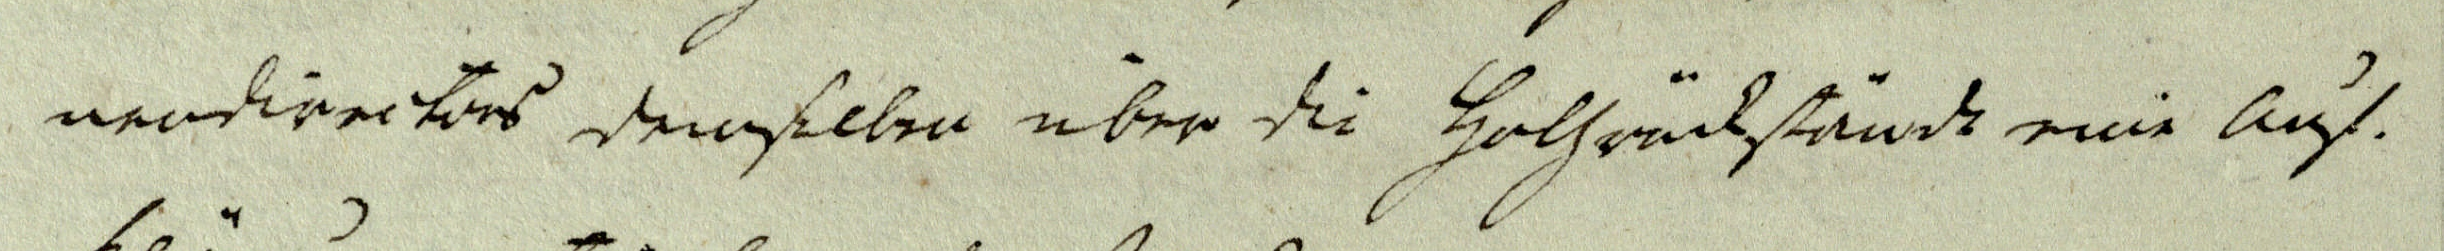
nendirectors demselben über die Holzrückstände eine Auf¬
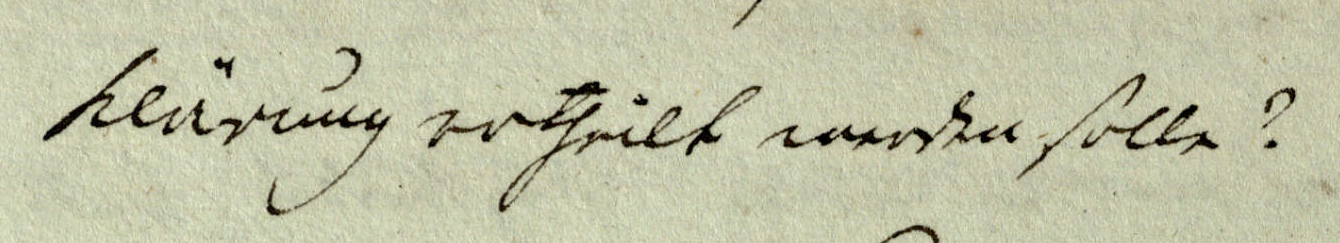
klärung ertheilt werden solle?
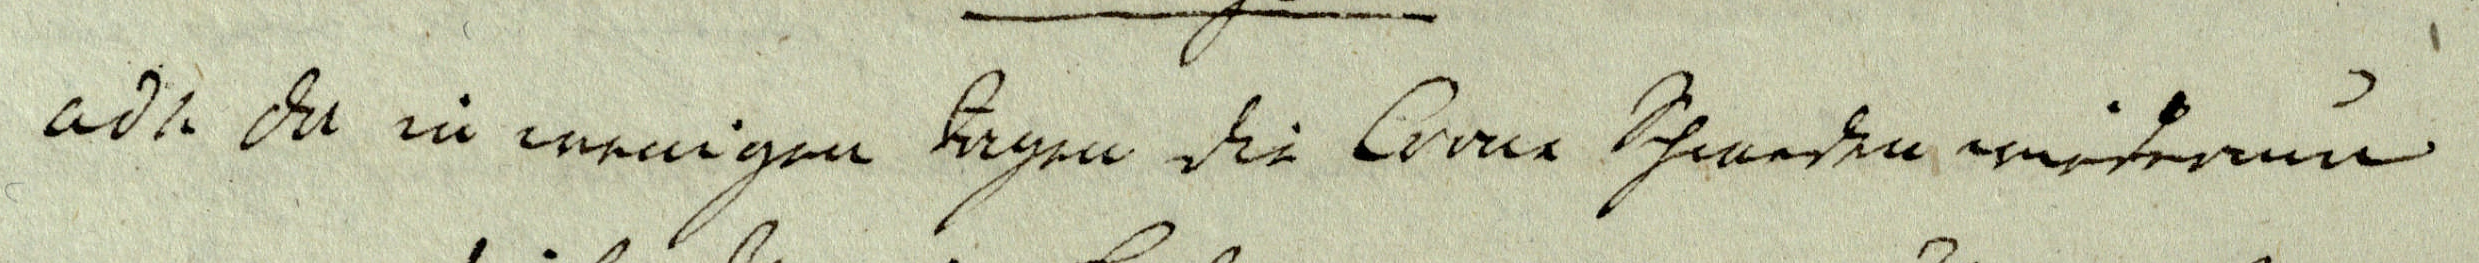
ad 1. Da in wenigen Tagen die Crone Schweden wiederum
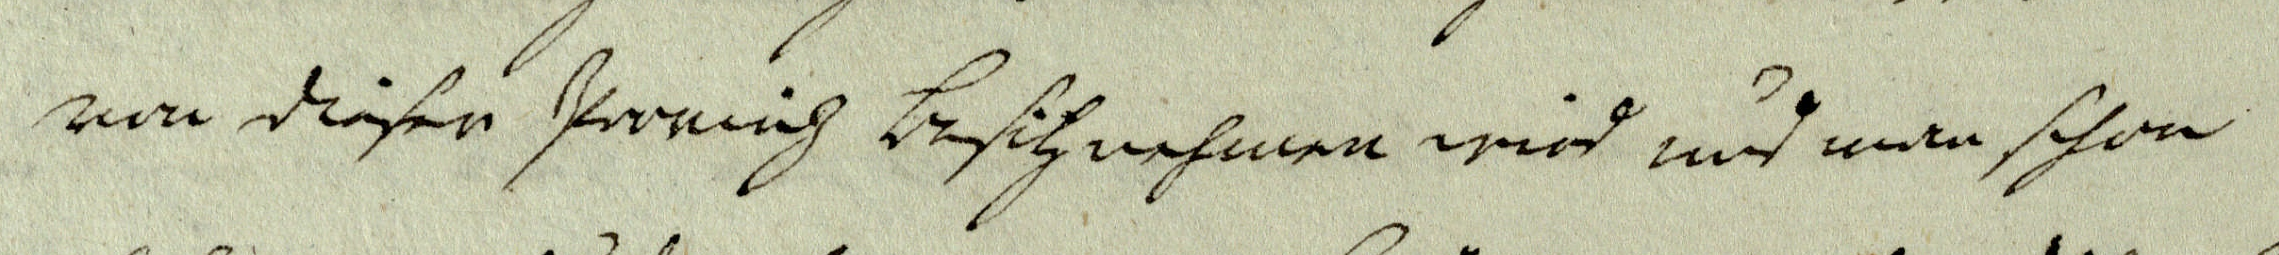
von dieser Provinz Besitznehmen wird und man schon
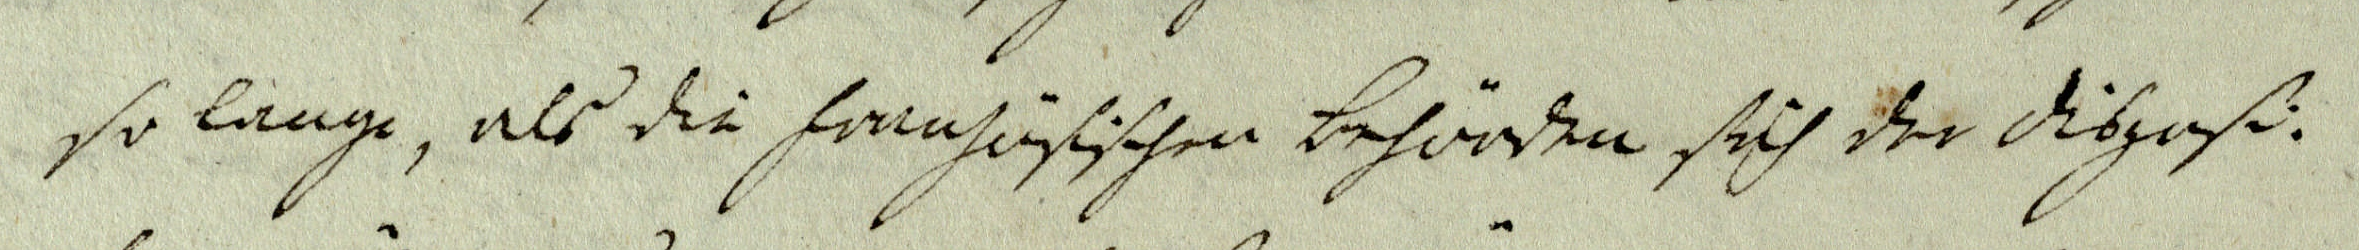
so lange, als die französischen Behörden sich der disposi¬
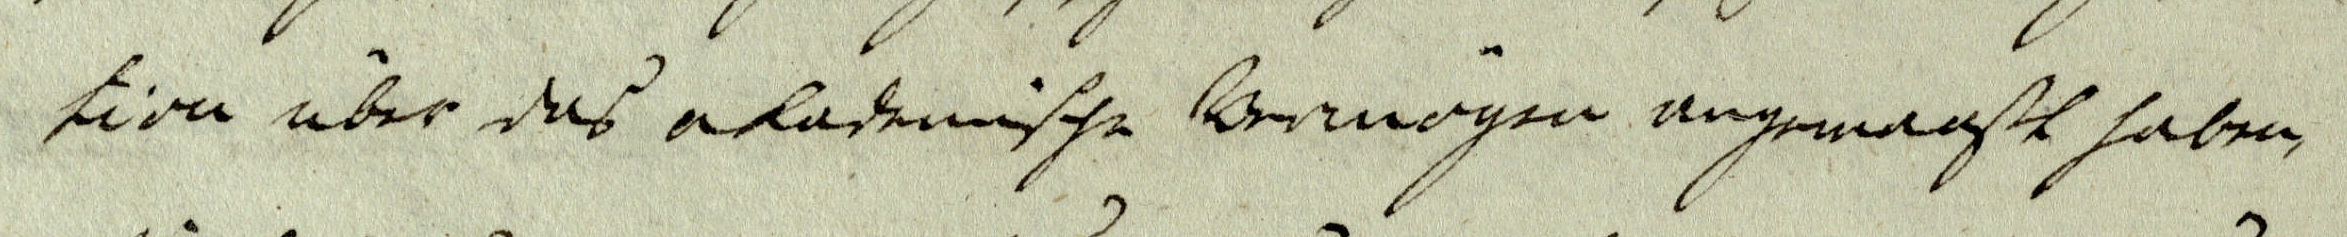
tion über das akademische Vermögen angemaaßt haben,
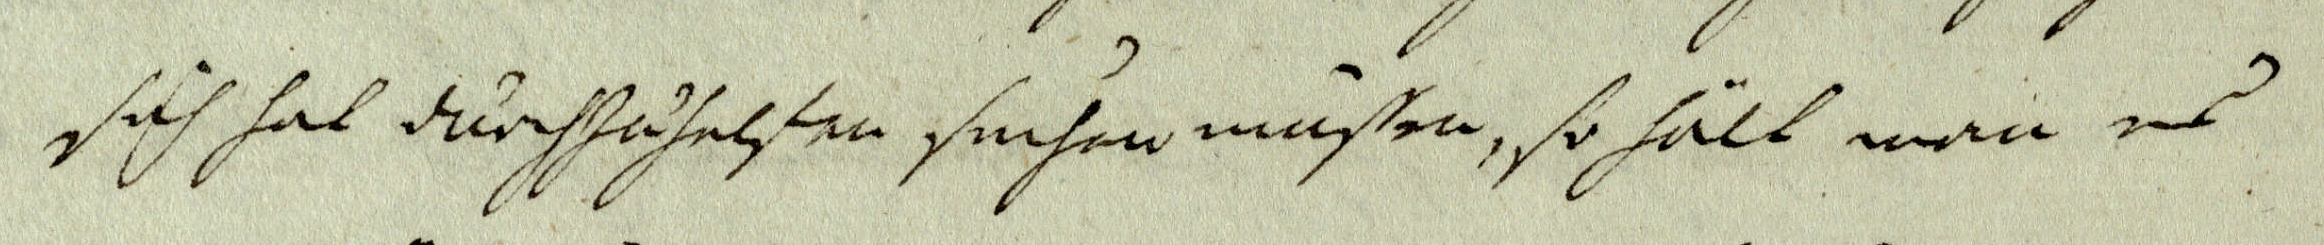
sich hat durchzuhelfen suchen müssen, so hält man es
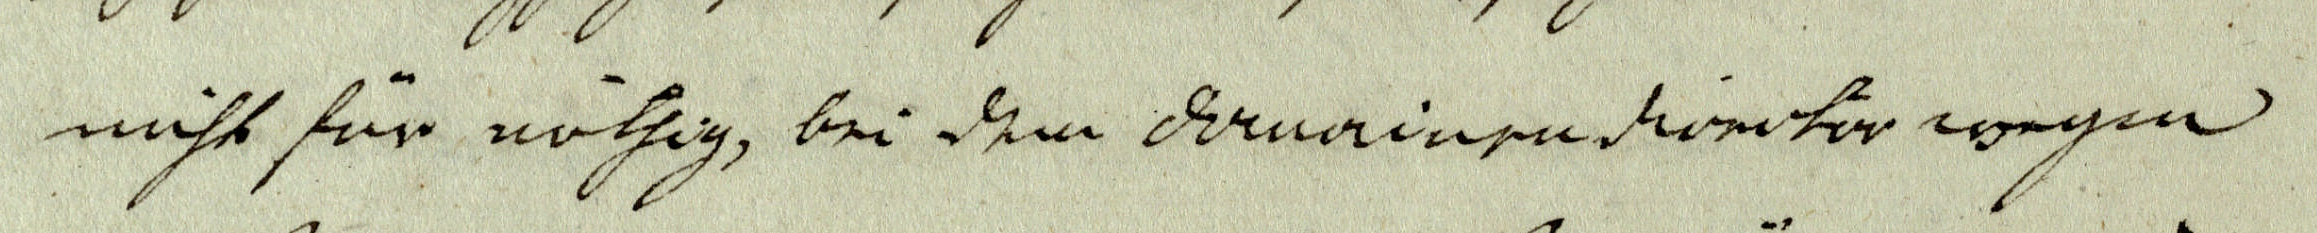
nicht für nöthig, bei dem Domainendirector wegen
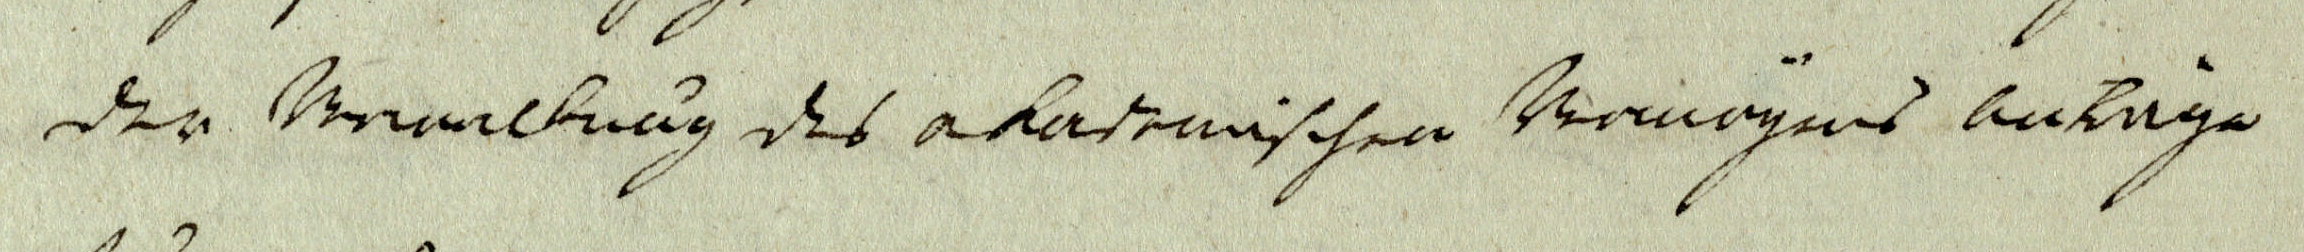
der Verwaltung des akademischen Vermögens Anträge
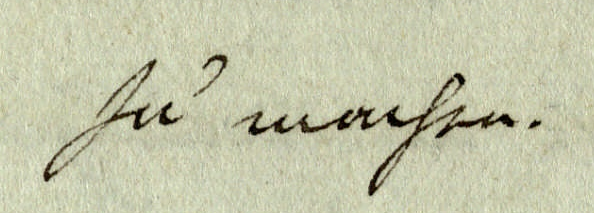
zu machen.
